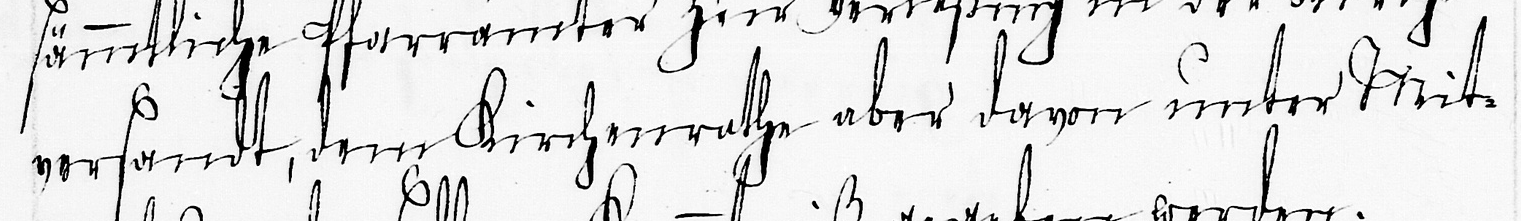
versandt, dem Kirchenrathe aber davon unter Mit¬
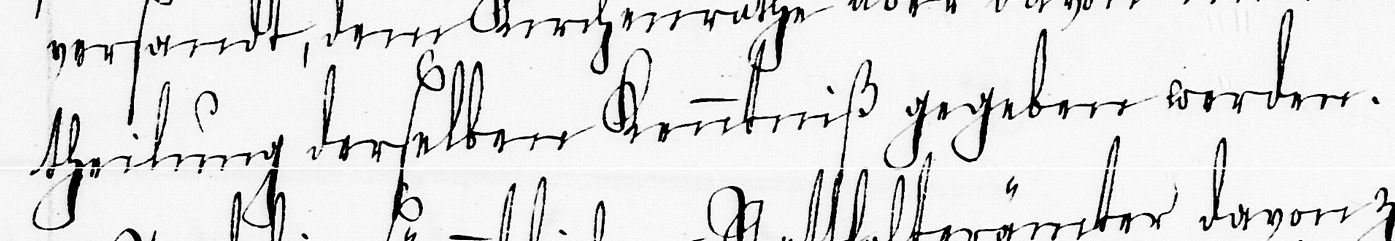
theilung derselben Kenntniß gegeben werden.
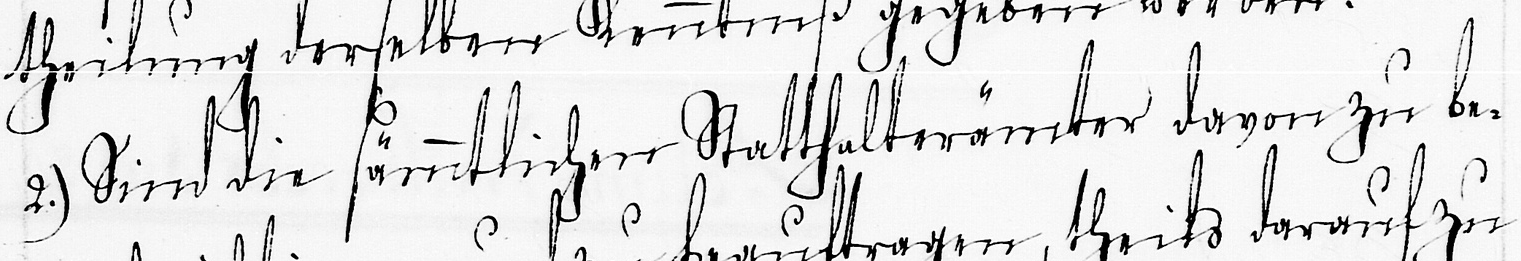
2.) Sind die sämmtlichen Statthalterämter davon zu be¬
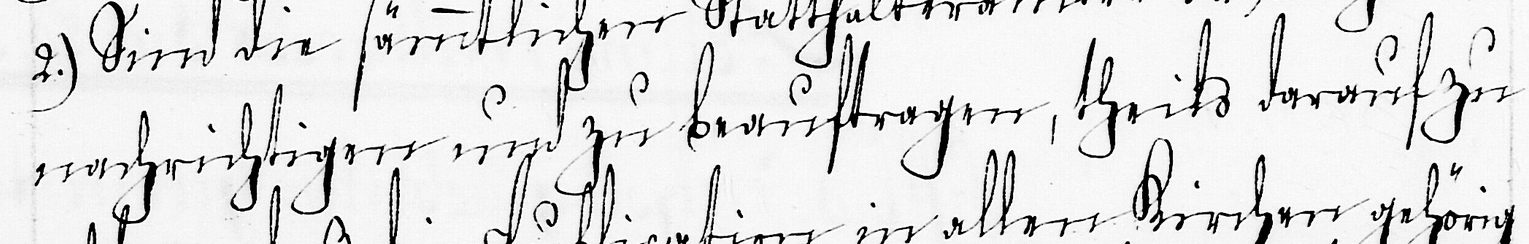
nachrichtigen und zu beauftragen, theils darauf zu
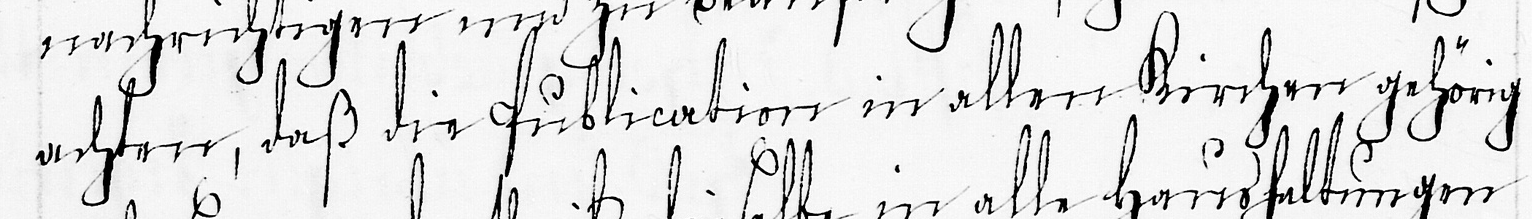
achten, daß die Publication in allen Kirchen gehörig
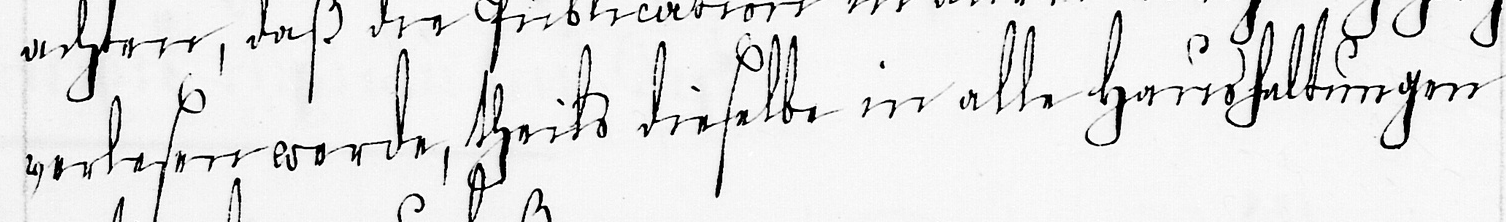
verlesen werde, theils dieselbe in alle Haushaltungen
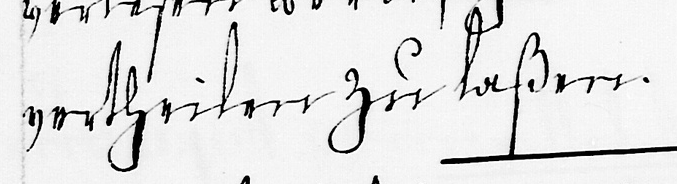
vertheilen zu laßen.
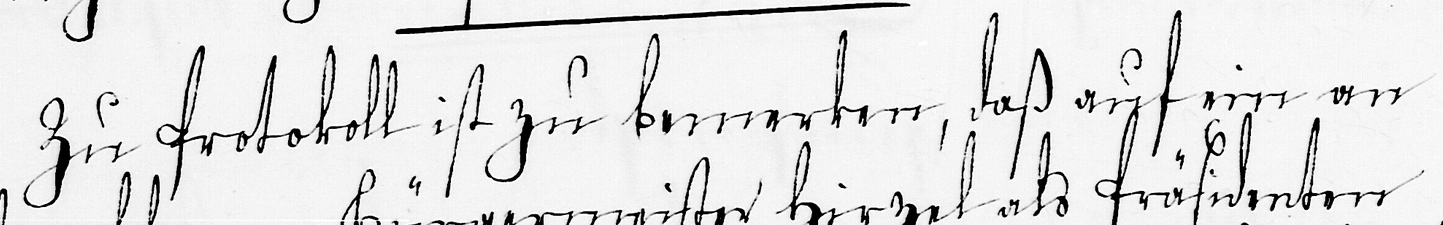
Zu Protokoll ist zu bemerken, daß auf ein an
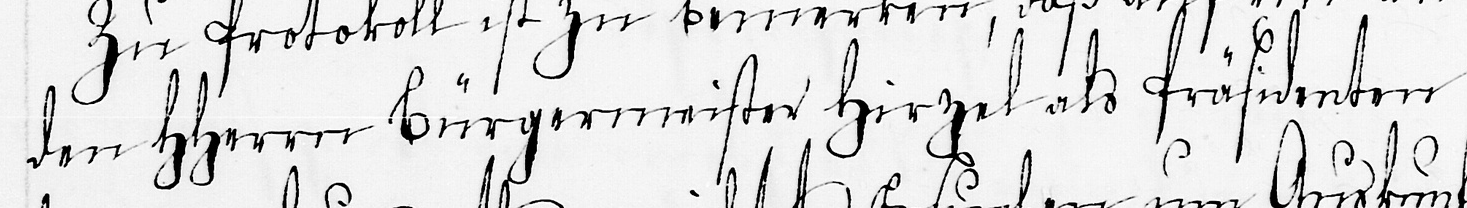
den HHerrn Bürgermeister Hirzel als Präsidenten
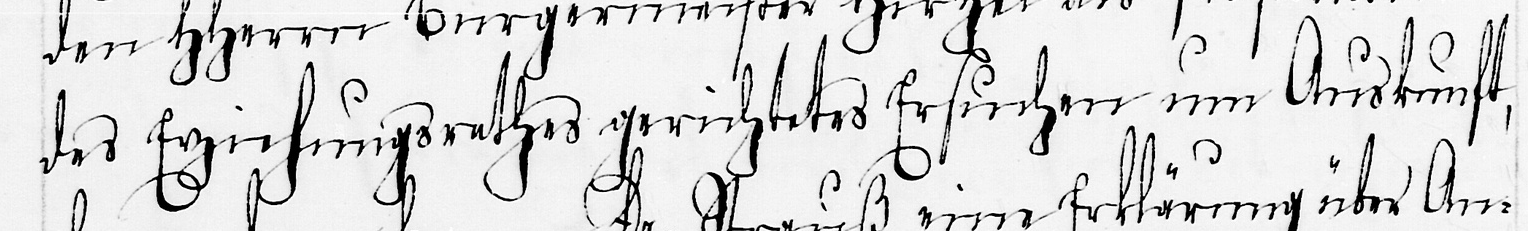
des Erziehungsrathes gerichtetes Ersuchen um Auskunft,
